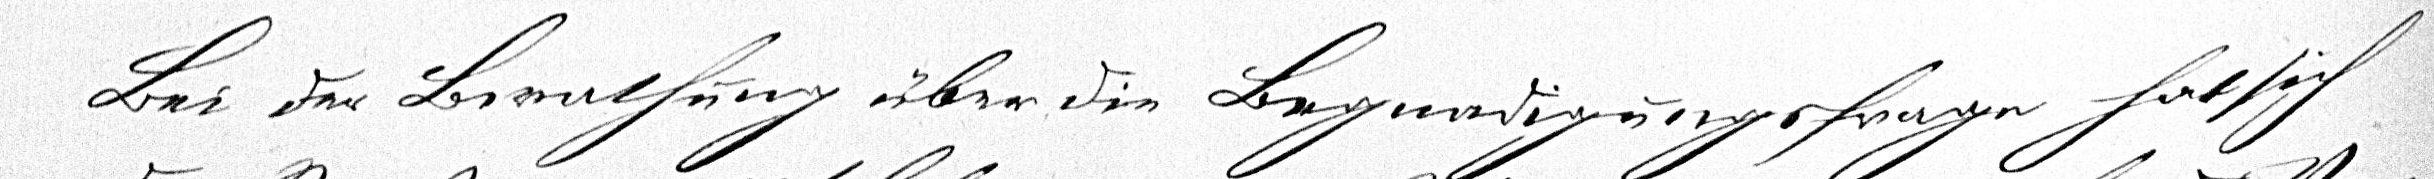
Bei der Berathung über die Begnadigungsfrage hat sich
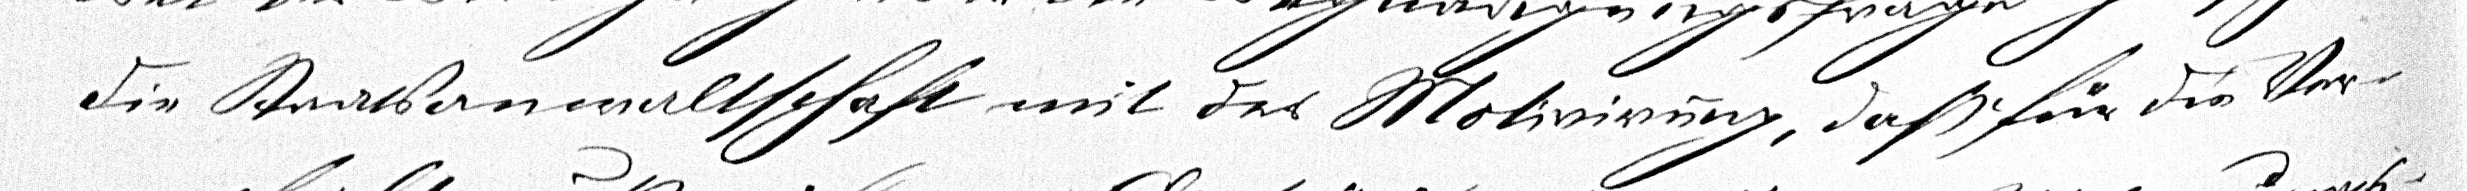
die Staatsanwaltschaft mit der Motivirung, daß für die Ver¬
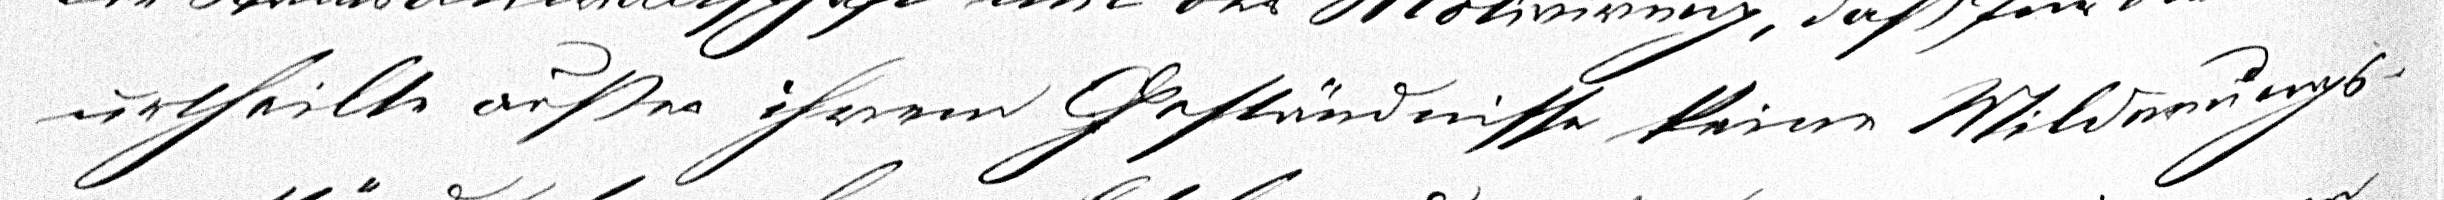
urtheilte außer ihrem Geständnisse keine Milderungs¬
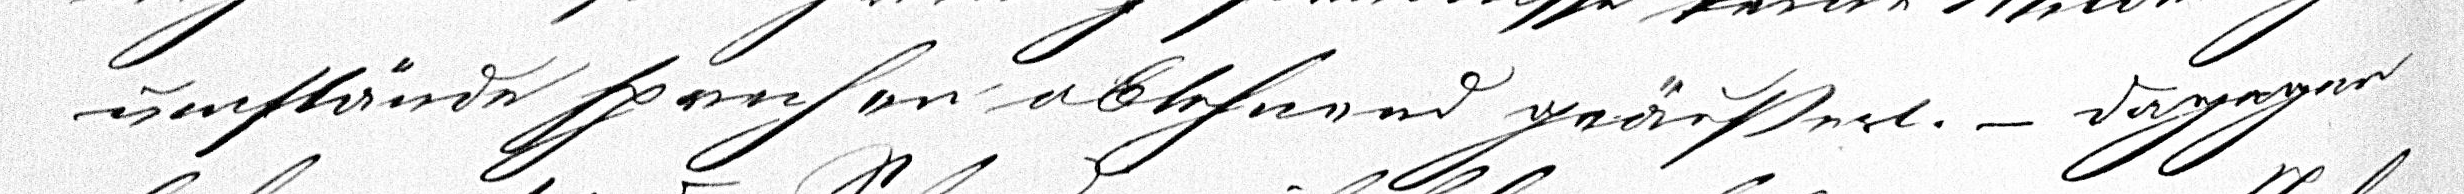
umstände sprechen' ablehnend geäußert. - Dagegen
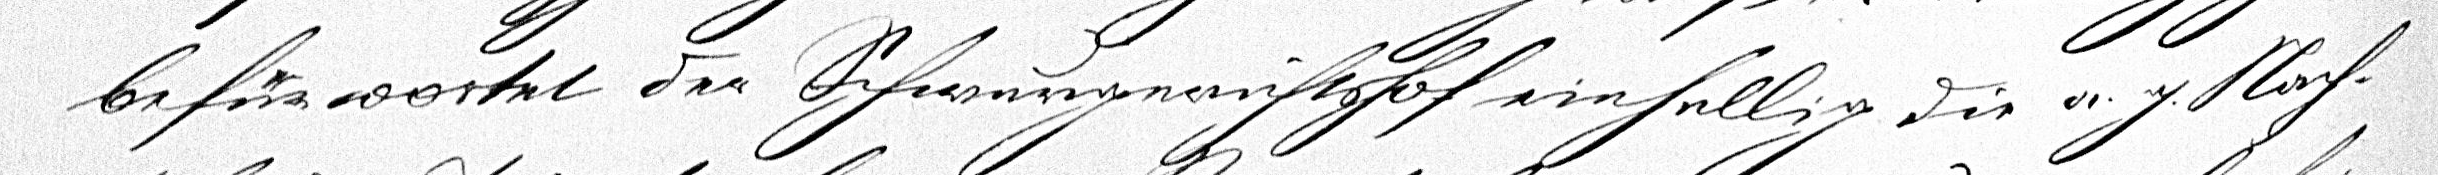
befürwortet der Schwurgerichtshof einhellig die a. g. Nach¬
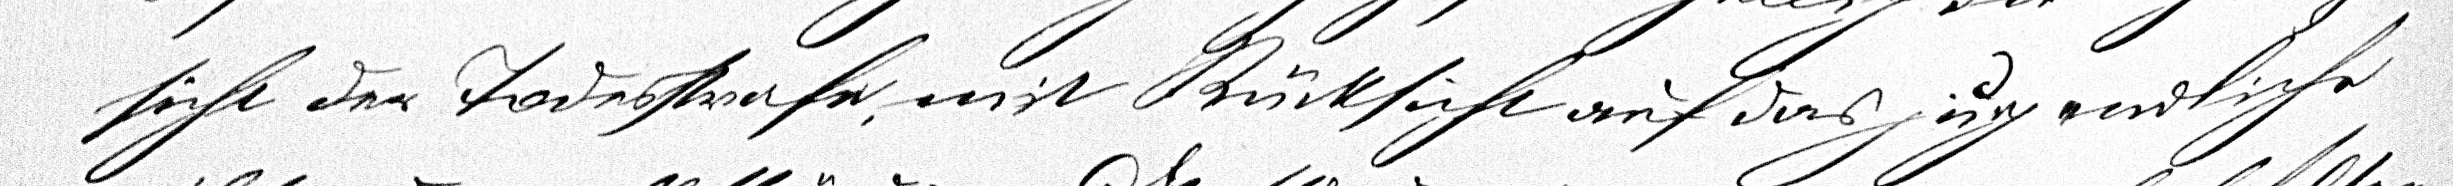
sicht der Todesstrafe, mit Rücksicht auf das jugendliche
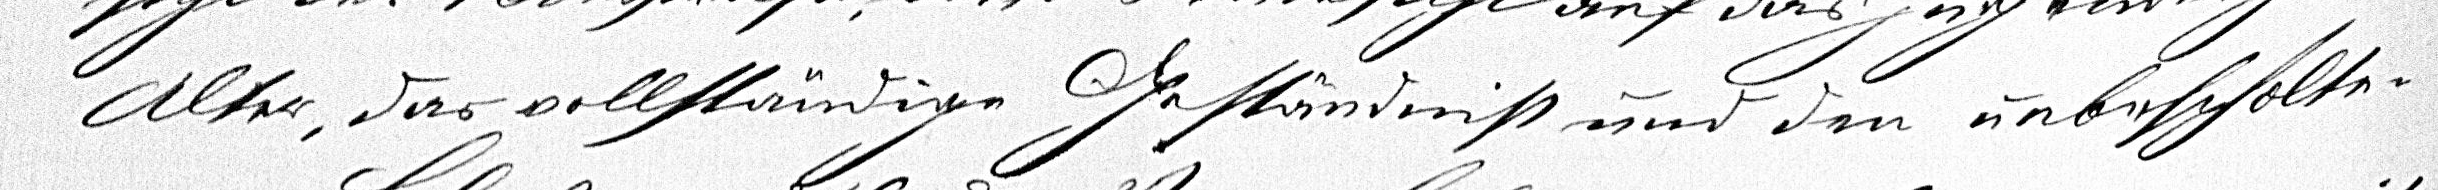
Alter, das vollständige Geständniß und den unbescholte¬
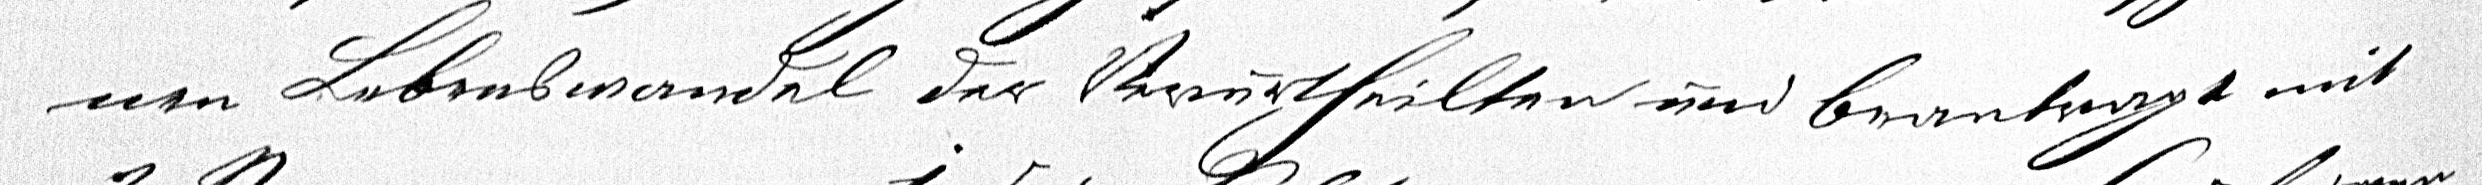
nen Lebensmandel der Verurtheilten und beantragt mit
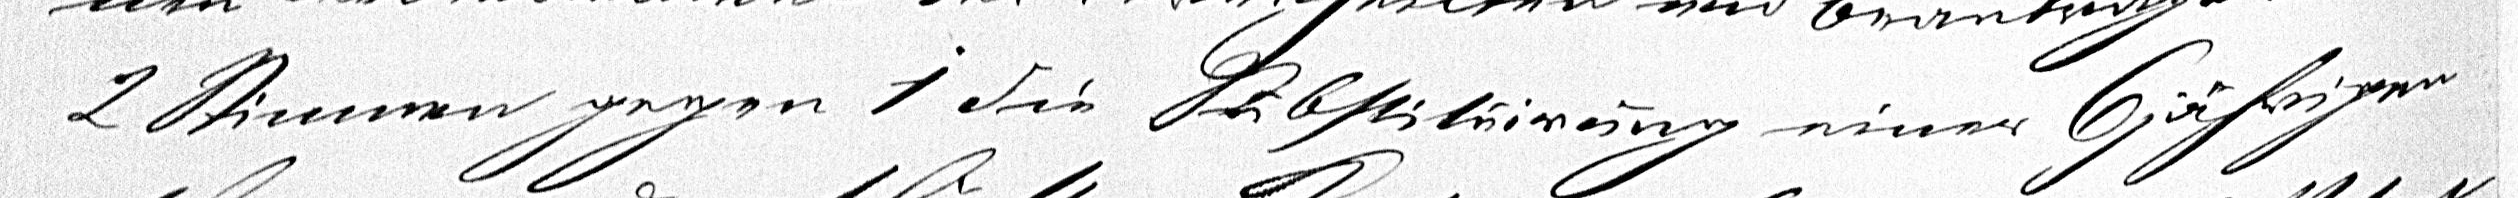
2 Stimmen gegen 1 die Substituirung einer 6jährigen
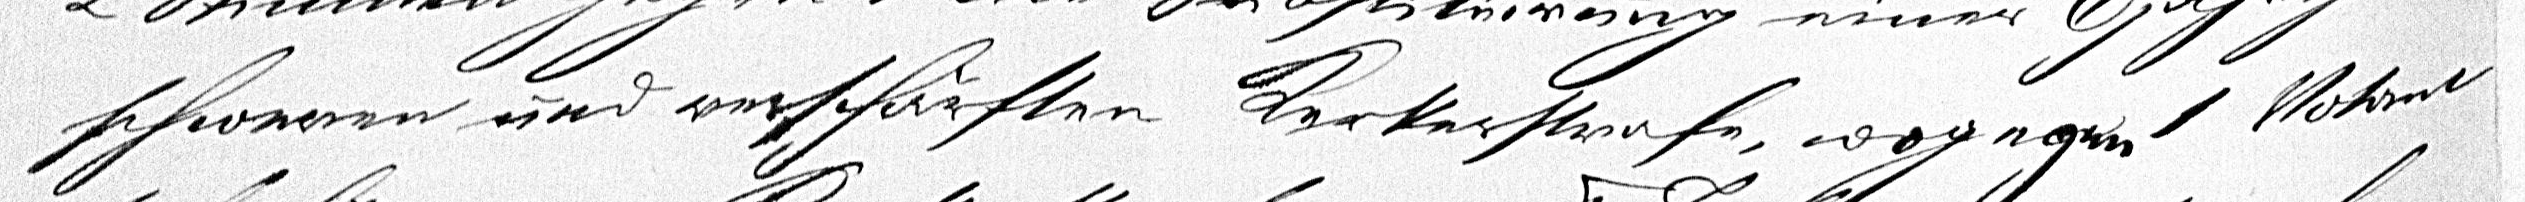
schweren und verschärften Kerkerstrafe, wogegen 1 Volant
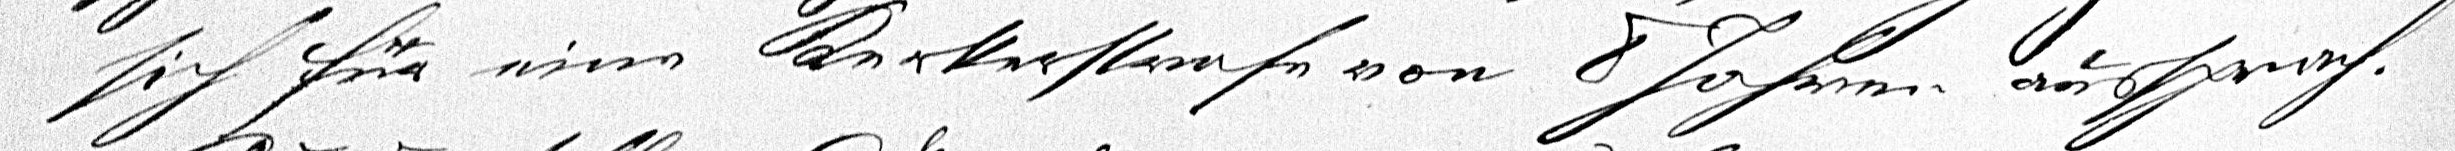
sich für eine Kerkerstrafe von 8 Jahren aussprach.
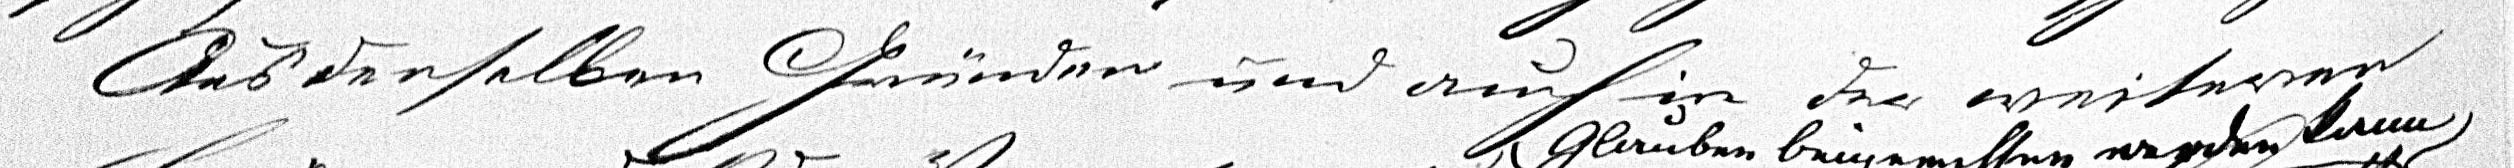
Aus derselben Gründen und auch in der weiteren
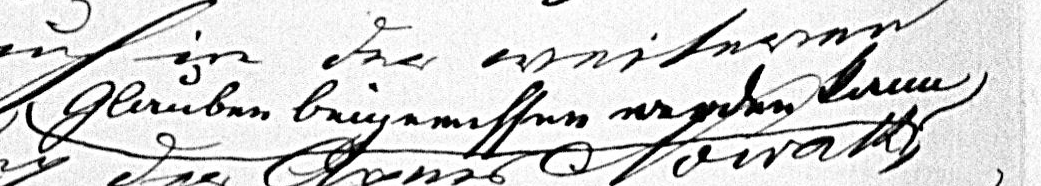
Glauben beigemessen werden kann
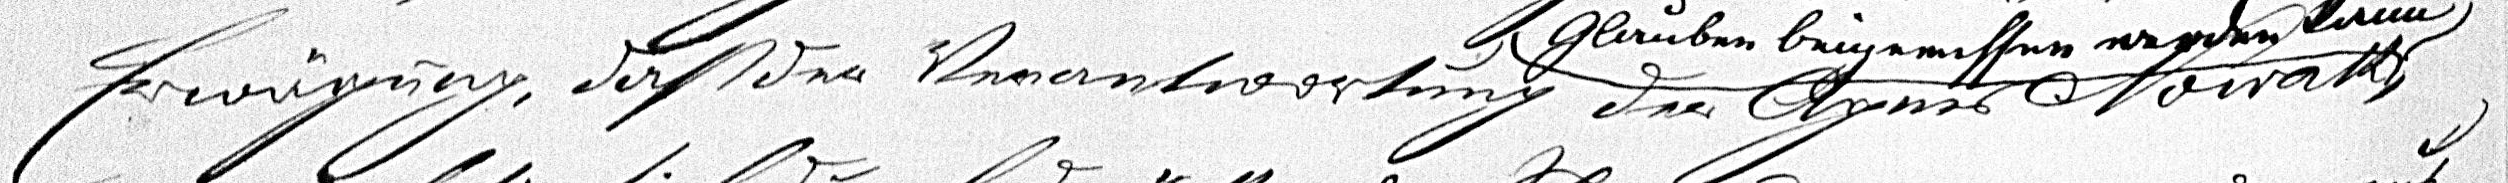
Erwägung, daß der Verantwortung der Agnes Nowak
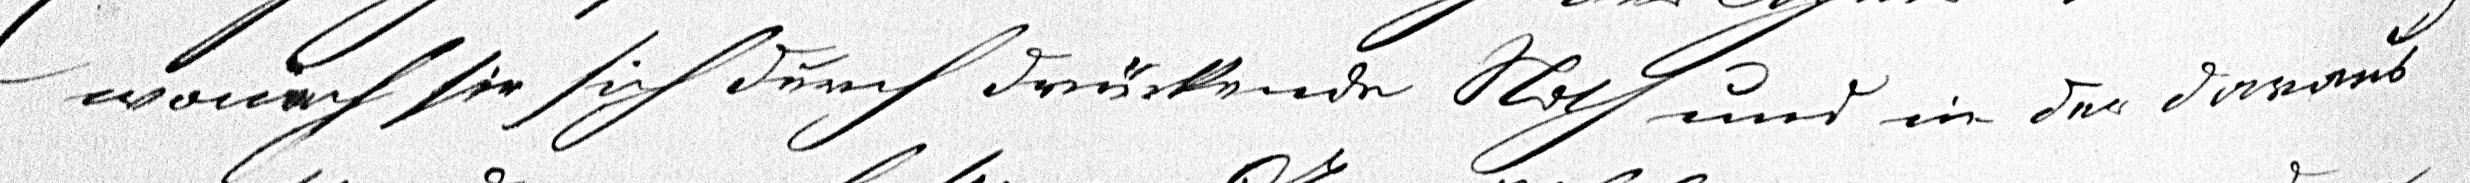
wonach sie sich durch drückende Noth und in der daraus
